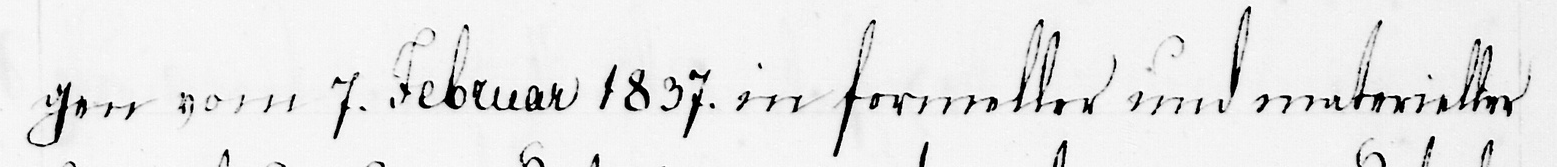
gen vom 7. Februar 1837. in formeller und materieller
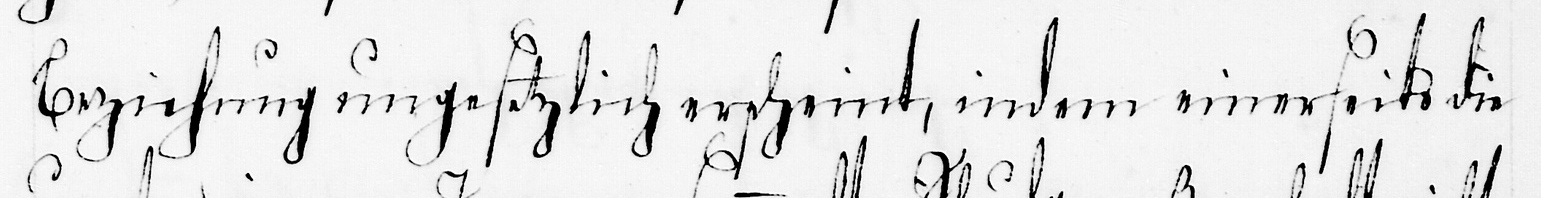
Beziehung ungesetzlich erscheint, indem einerseits die
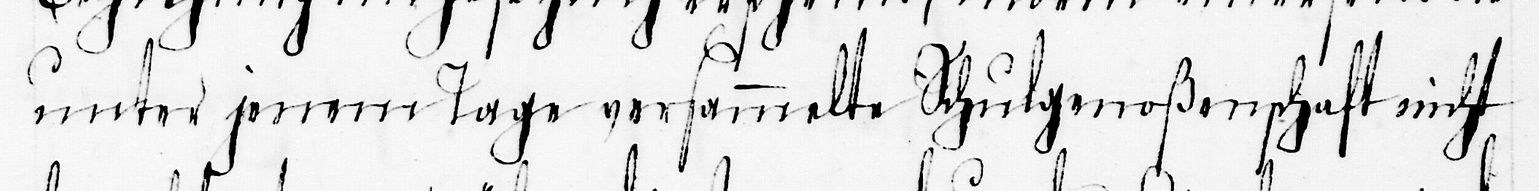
unter jenem Tage versammelte Schulgenoßenschaft nicht
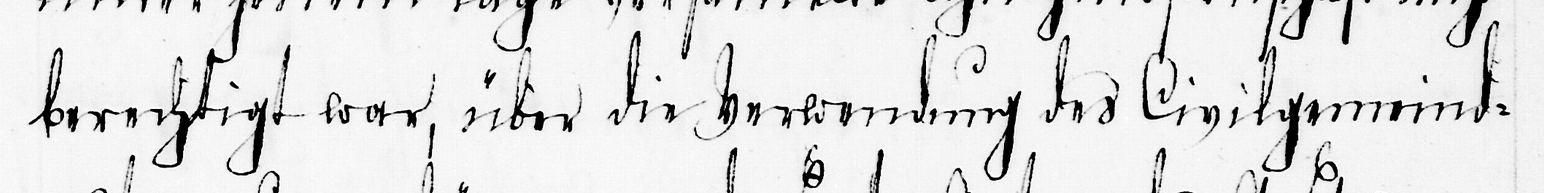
berechtigt war, über die Verwendung des Civilgemeind¬
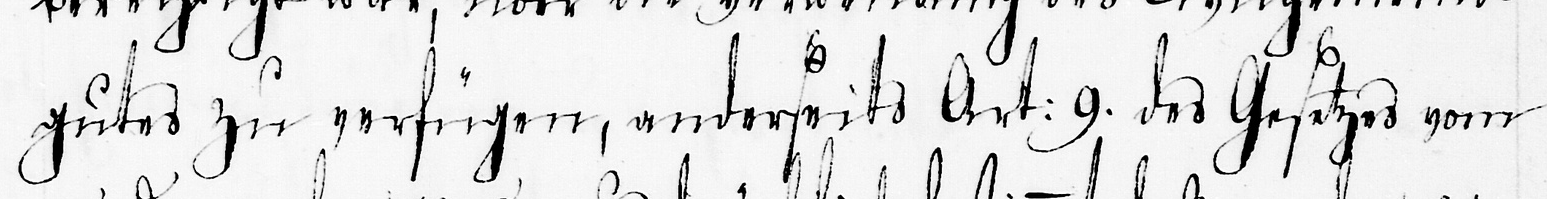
gutes zu verfügen, anderseits Art: 9. des Gesetzes vom
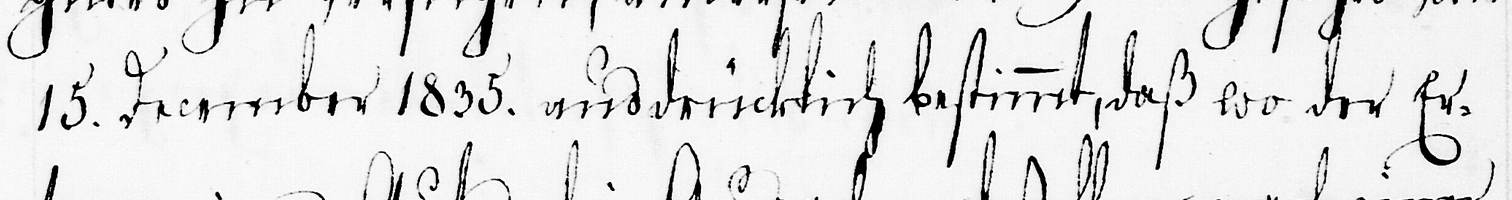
15. December 1835. ausdrücklich bestimmt, daß wo der Er¬
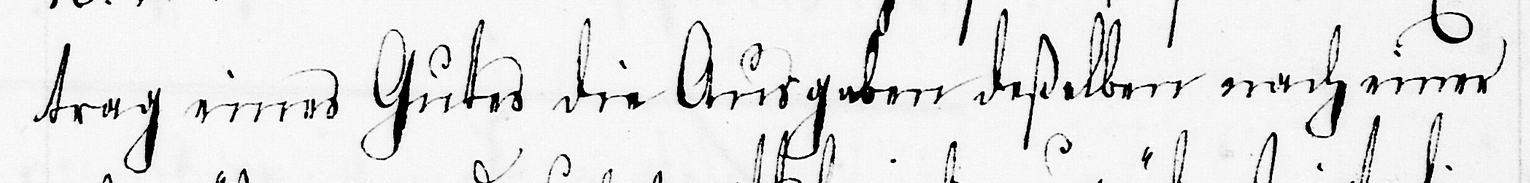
trag eines Gutes die Ausgaben deßelben nach einer
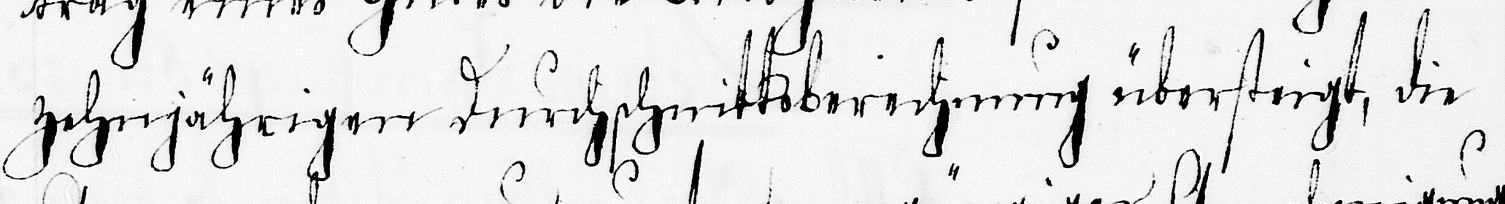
zehnjährigen Durchschnittsberechnung übersteigt, die
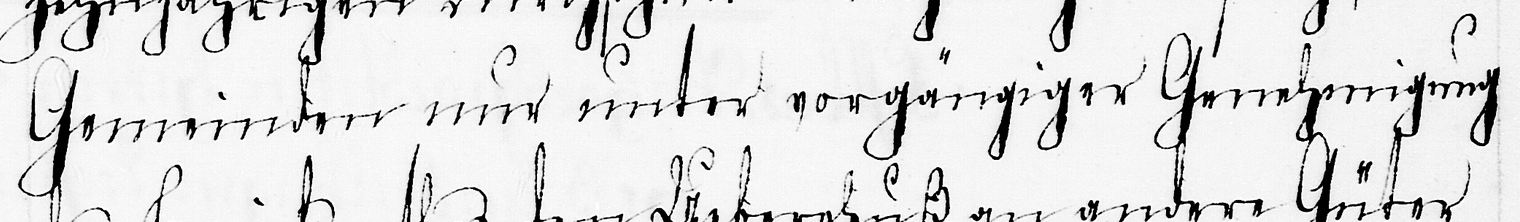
Gemeinden nur unter vorgängiger Genehmigung
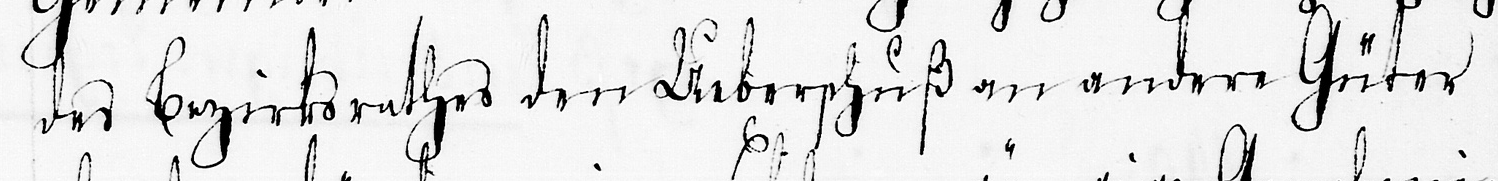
des Bezirksrathes den Ueberschuß an andere Güter
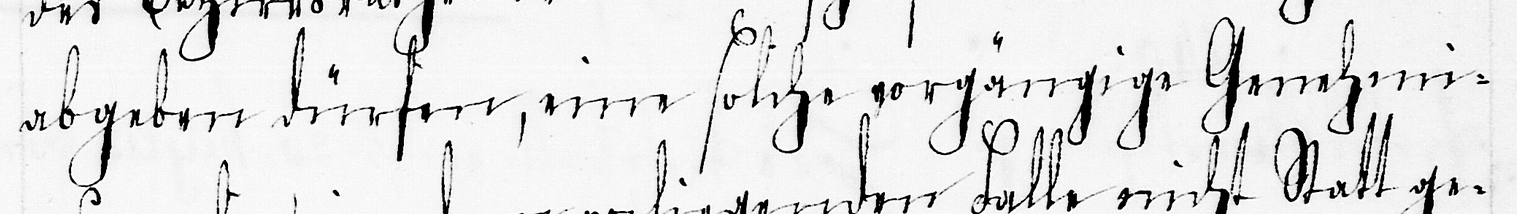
abgeben dürfen, eine solche vorgängige Genehmi¬
